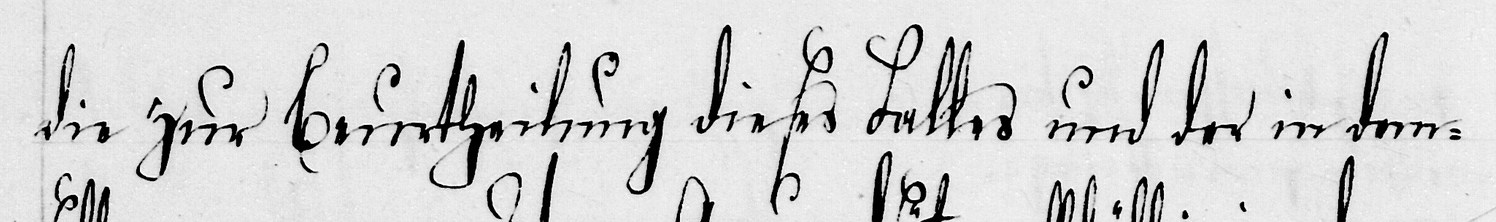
die zur Beurtheilung dieses Falles und der in dem¬
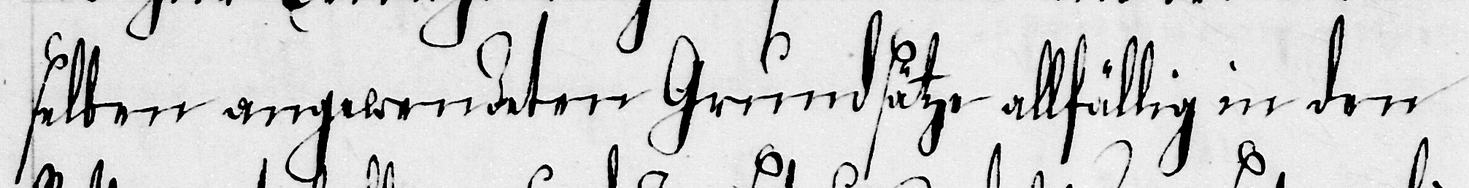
selben angewendeten Grundsätze allfällig in den
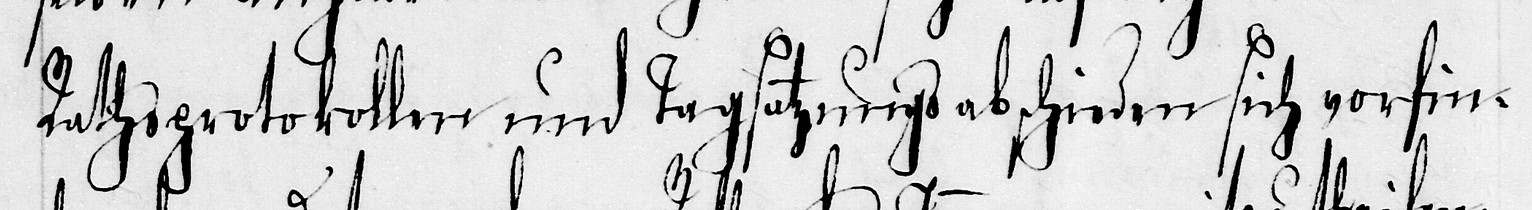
Rathsprotokollen und Tagsatzungsabschieden sich vorfin¬
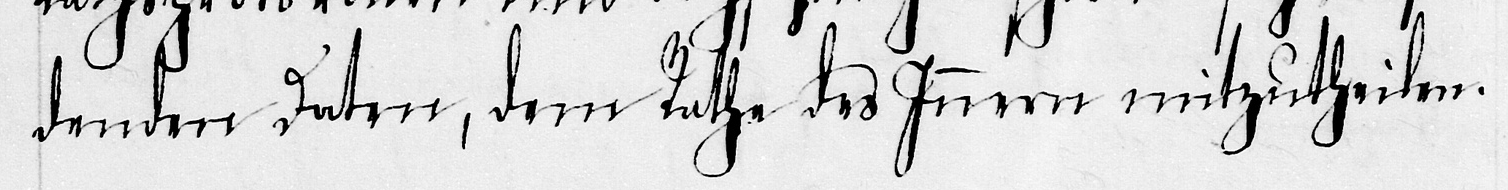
denden Daten, dem Rathe des Innern mitzutheilen.
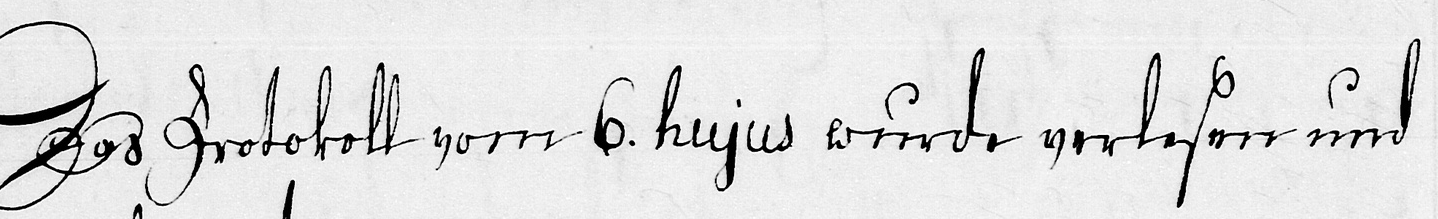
Das Protokoll vom 6. hujus wurde verlesen und
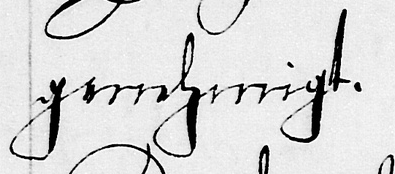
genehmigt.
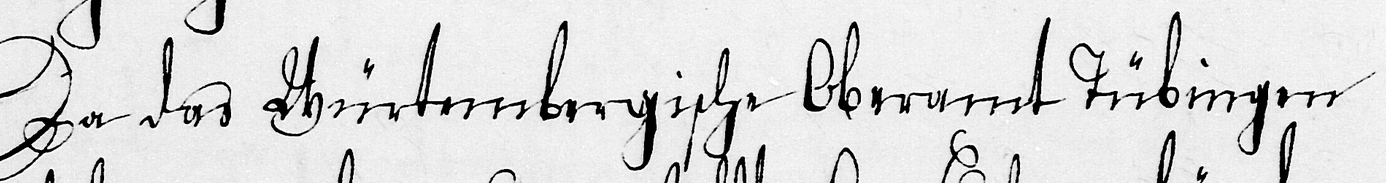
Da das Würtembergische Oberamt Tübingen
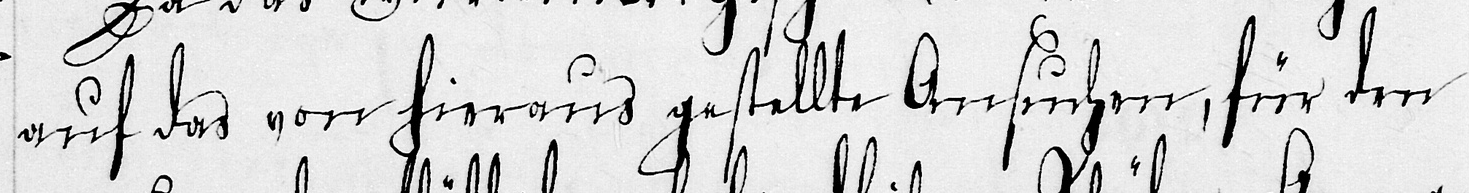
auf das von hieraus gestellte Ansuchen, für den
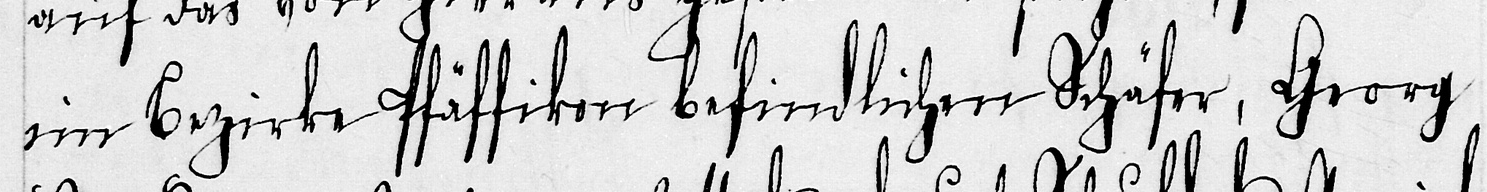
im Bezirke Pfäffikon befindlichen Schäfer, Georg
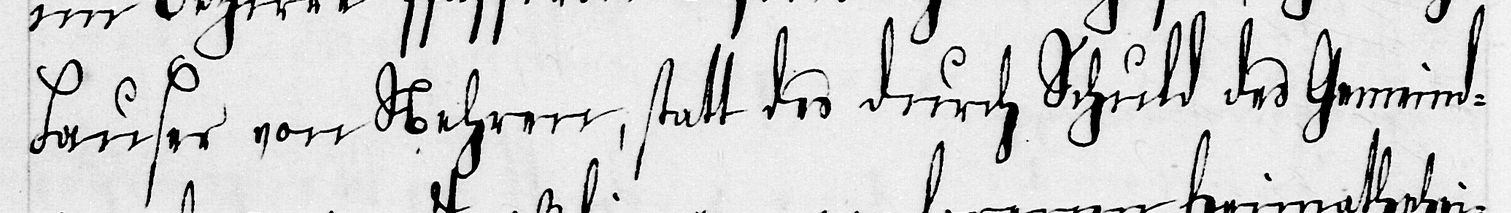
Lauser von Nehren, statt des durch Schuld des Gemeind¬
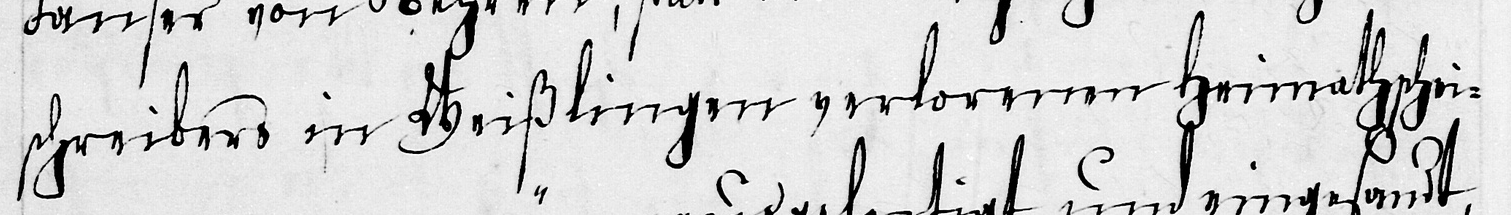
schreibers in Weißlingen verlorenen Heimathschei¬
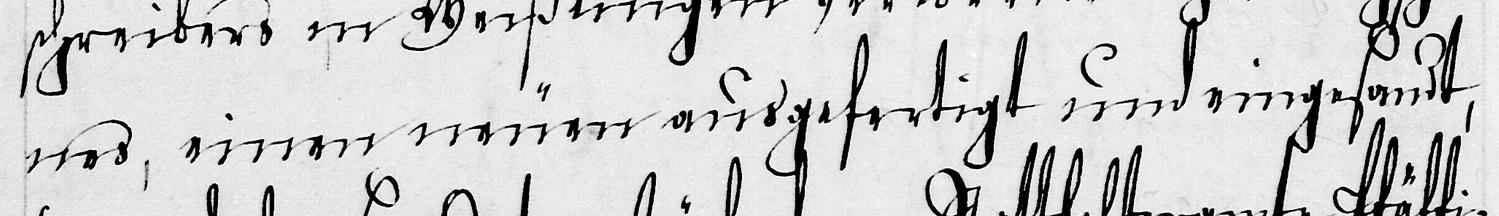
nes, einen neuen ausgefertigt und eingesandt,
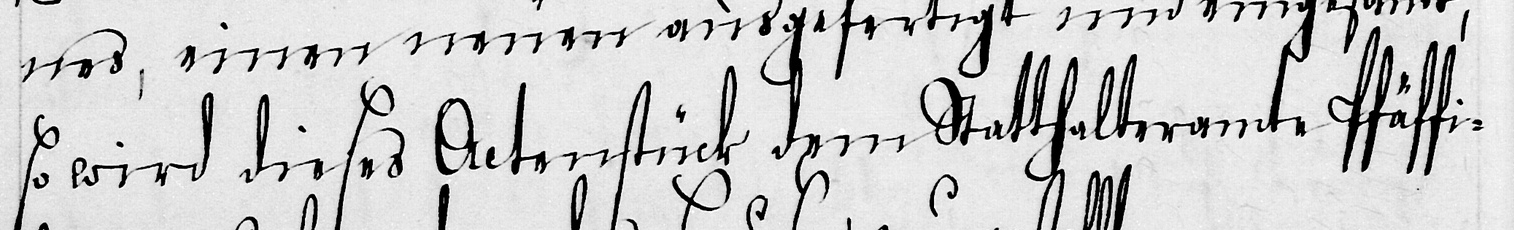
so wird dieses Actenstück dem Statthalteramte Pfäff¬
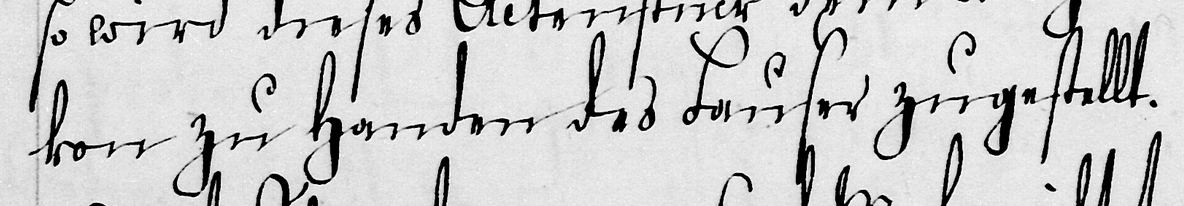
ikon zu Handen des Lauser zugestell¬
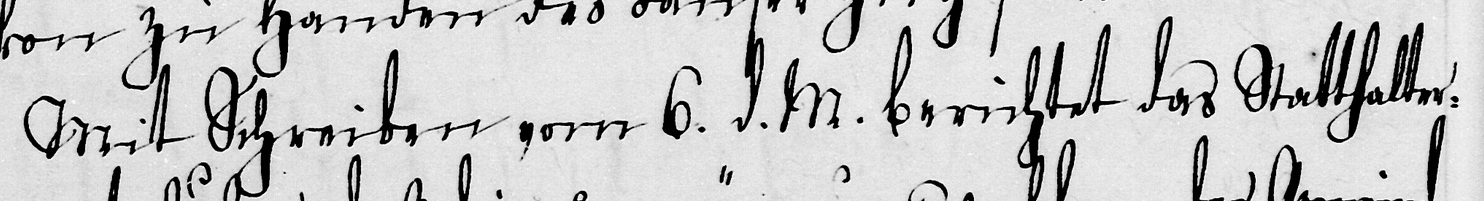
Mit Schreiben vom 6. d. M. berichtet das Statthalte¬
